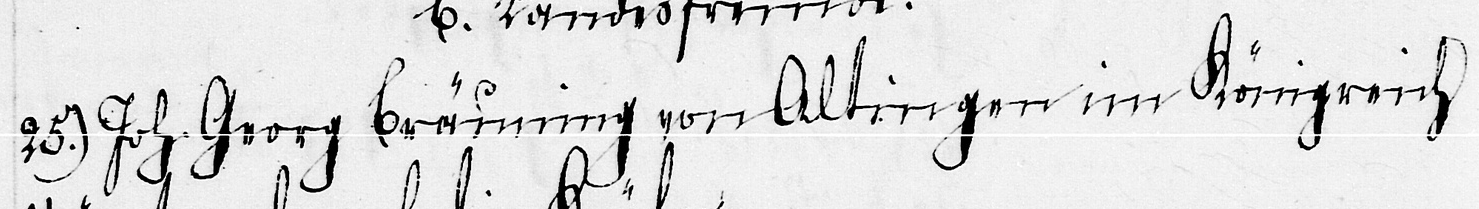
25.) Joh. Georg Bräuning von Altingen im Königreich
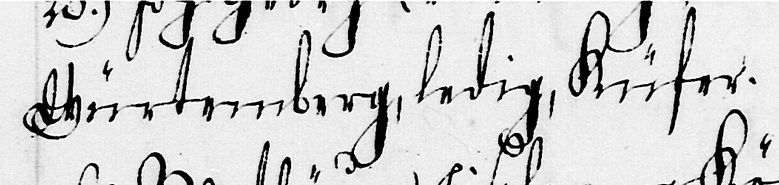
Würtemberg, ledig, Küfer.
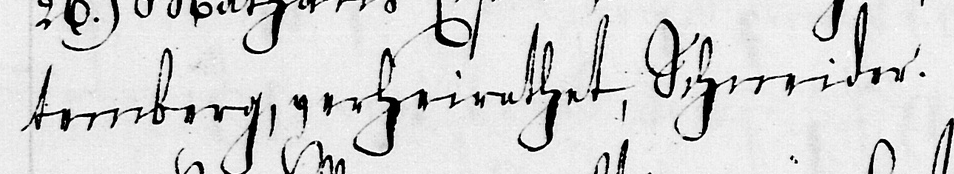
temberg, verheirathet, Schneider.
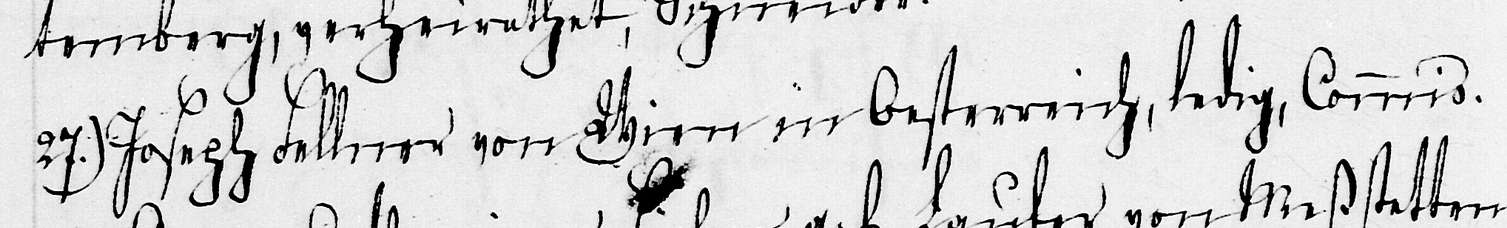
27.) Joseph Fellner von Wien in Oesterreich, ledig, Commis.
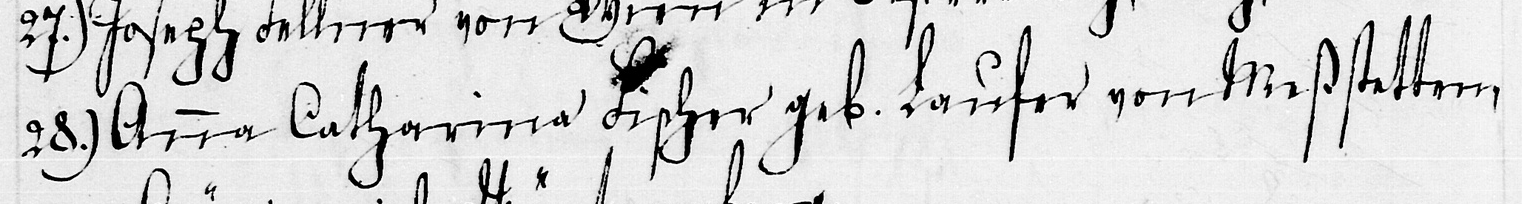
28.) Anna Catharina Fischer geb. Laufer von Meßstetten,
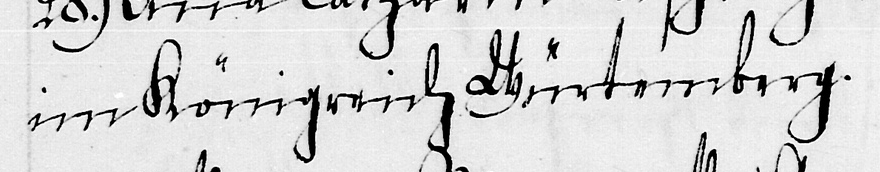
im Königreich Würtemberg.
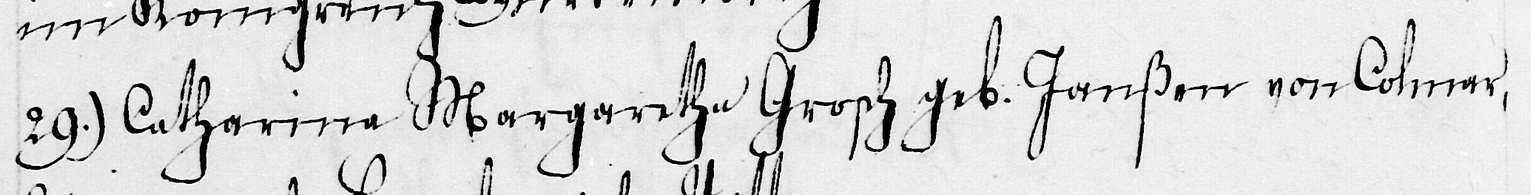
29.) Catharina Margaretha Grosch geb. Janßen von Colmar,
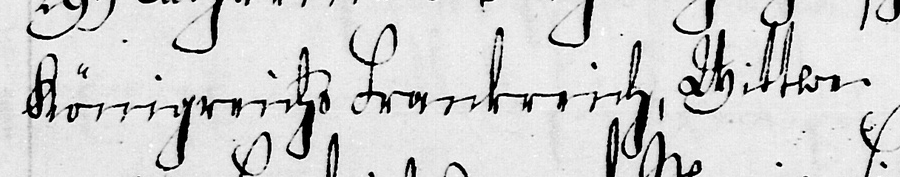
Königreichs Frankreich, Wittwe.
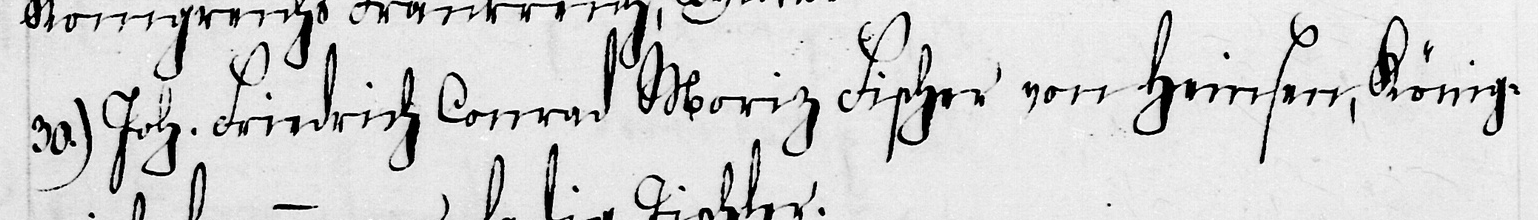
30.) Joh. Friedrich Conrad Moriz Fischer von Heinsen, König¬
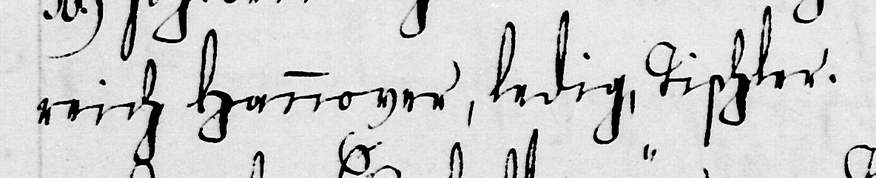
reich Hannover, ledig, Tischler.
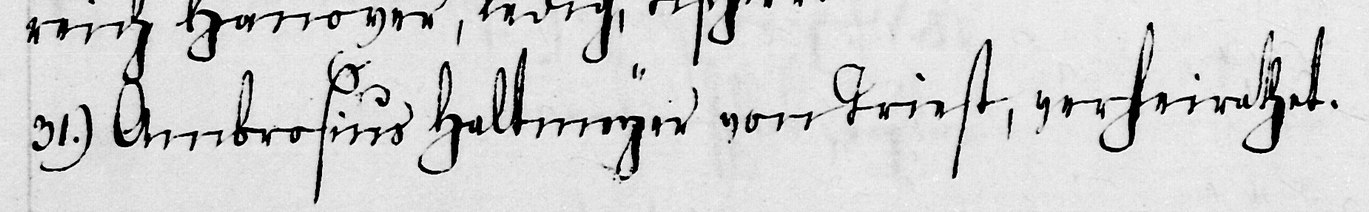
31.) Ambrosius Haltmeyer von Triest, verheirathet.
